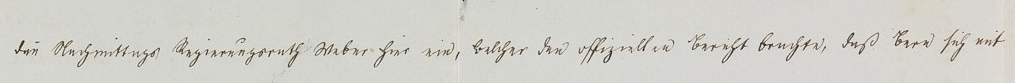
dann Nachmittags Regierungsrath Weber hier ein, welcher den offiziellen Bericht brachte, daß Bern sich mit
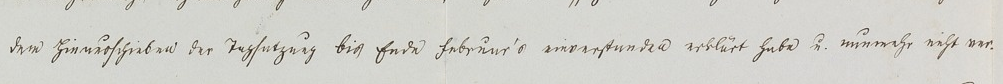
dem Hinausschieben der Tagsatzung bis Ende Februar's einverstanden erklärt habe u. nunmehr nicht ver-
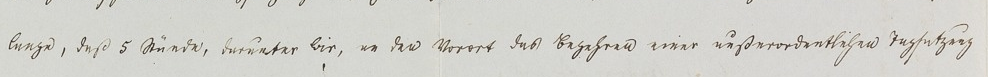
lange, daß 5 Stände, darunter wir, an den Vorort das Begehren einer außerordentlichen Tagsatzung
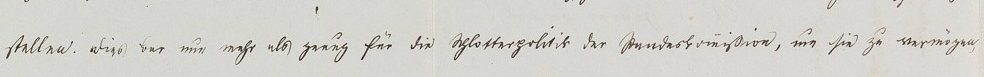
stellen. Dies war nun mehr als genug für die Schlotterpolitik der Standeskommißion, um sie zu vermögen,
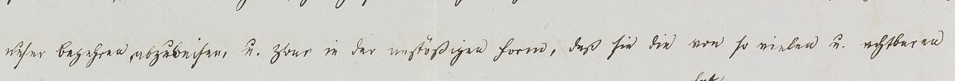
unser Begehren abzuweisen, u. zwar in der anstößigen Form, daß sie die von so vielen u. achtbaren
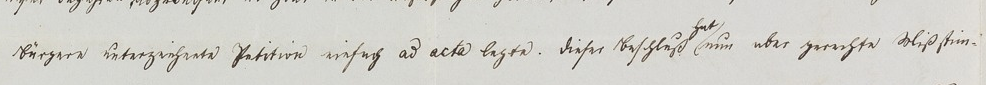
Bürgern unterzeichnete Petition einfach ad acta legte. Dieser Beschluß hat nun aber gerechte Mißstim-
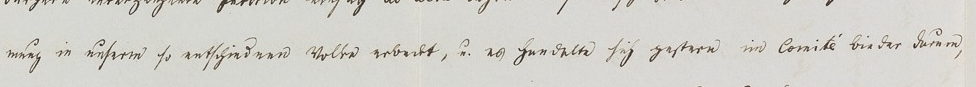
mung in unserm so entschiednen Volke erweckt, u. es handelte sich gestern im Comité wieder darum,
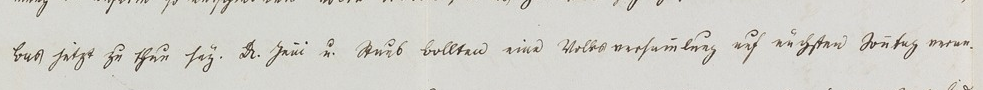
was jetzt zu thun sey. Dr. Jenni u. Staub wollten eine Volksversammlung auf nächsten Sonntag veran-
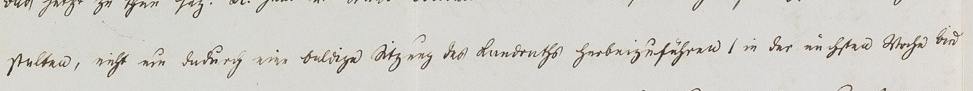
stalten, nicht um dadruch eine baldige Sitzung des Landraths herbeizuführen (in der nächsten Woche wird
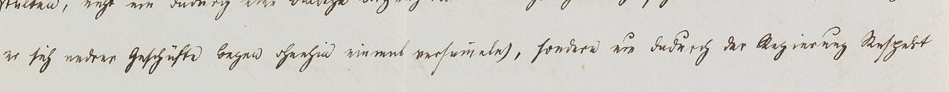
er sich andrer Geschäfte wegen ohnehin einmal versammeln), sondern um dadurch der Regierung Respekt
